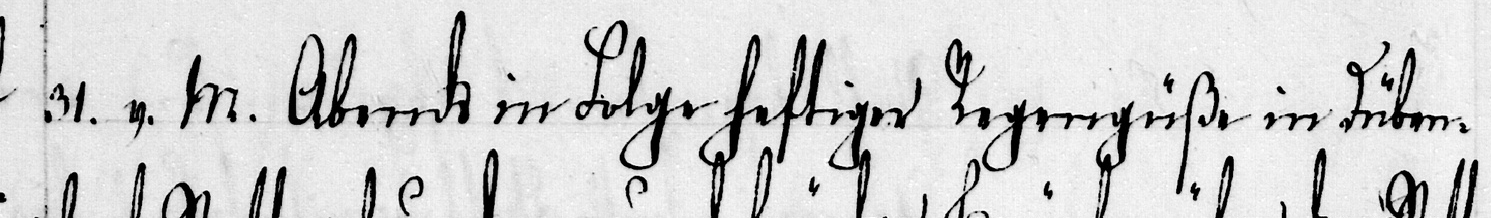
31. v. M. Abends in Folge heftiger Regengüße in Düben¬
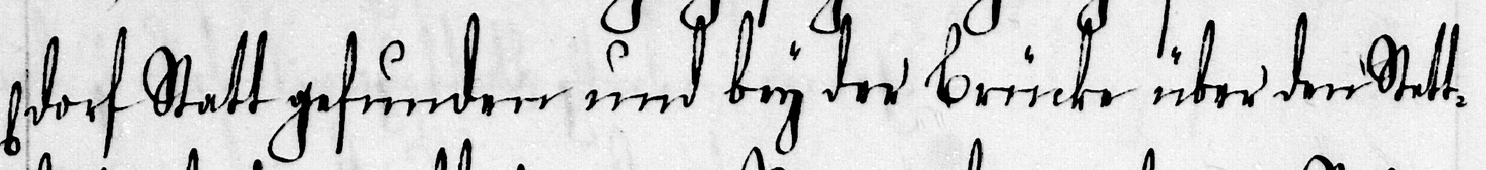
dorf Statt gefunden und bey der Brücke über den Stet¬
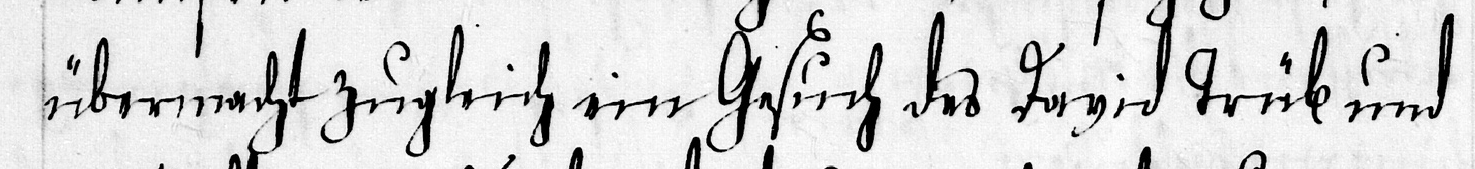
übermacht zugleich ein Gesuch des David Trüb und
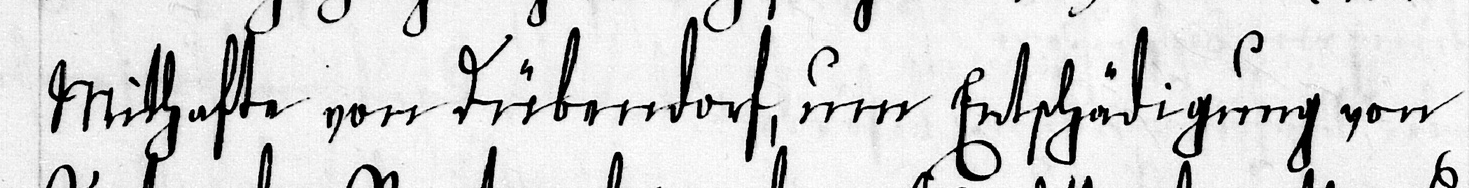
Mithafte von Dübendorf, um Entschädigung von
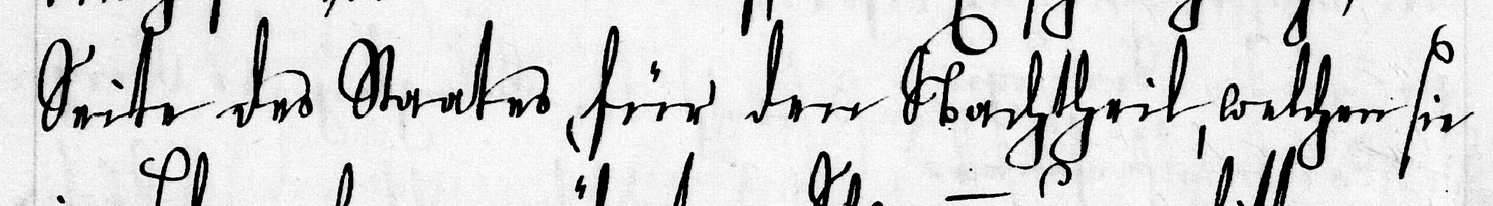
Seite des Staates, für den Nachtheil, welchen sie
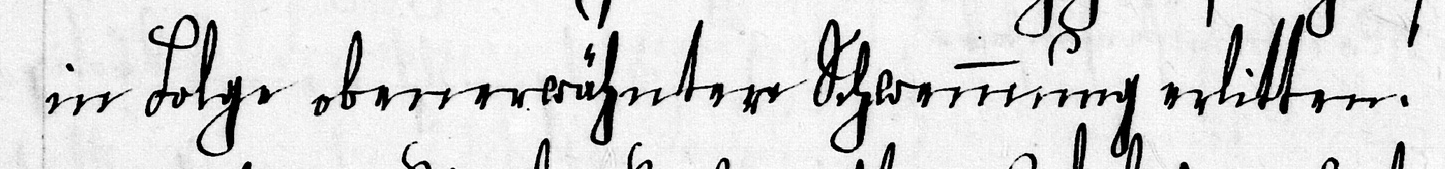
in Folge obenerwähnter Schwemmung erlitten.
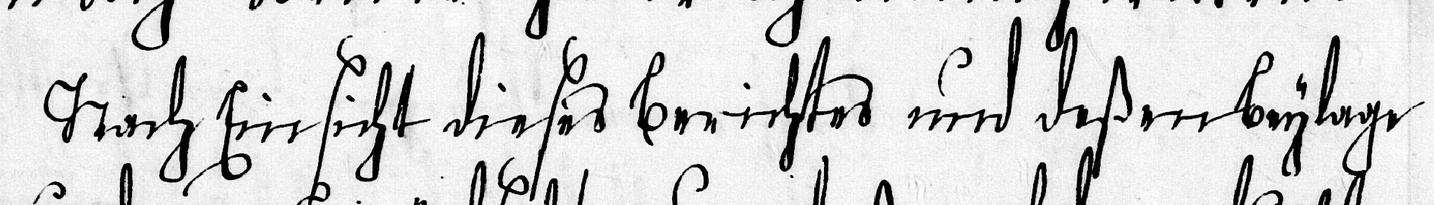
Nach Einsicht dieses Berichtes und deßen Beylage
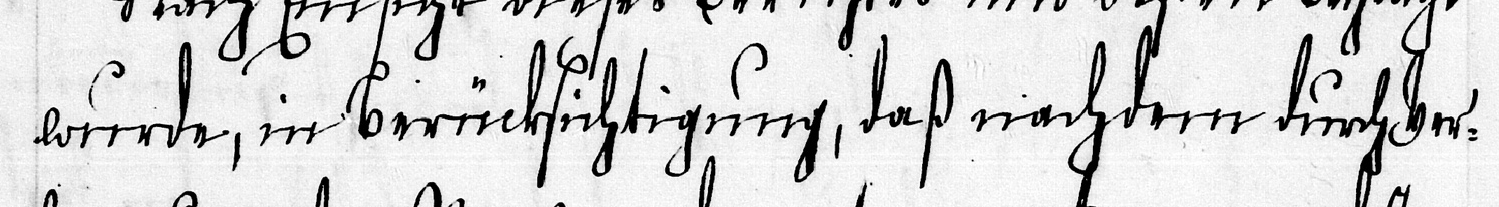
wurde, in Berücksichtigung, daß nachdem durch Ve¬
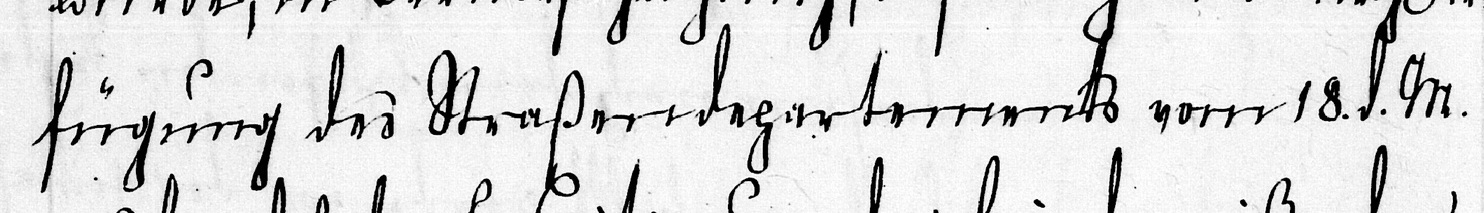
rfügung des Straßendepartements vom 18. d. M.
